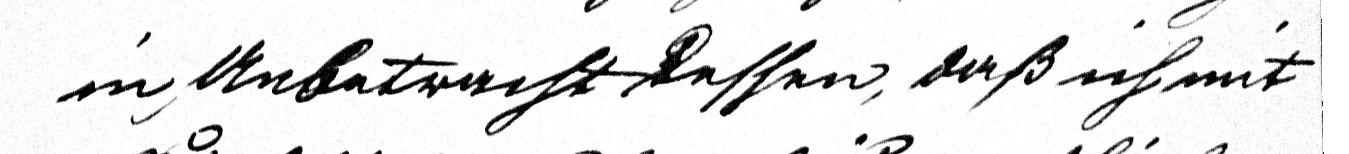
in Anbetracht dessen, daß ich mit
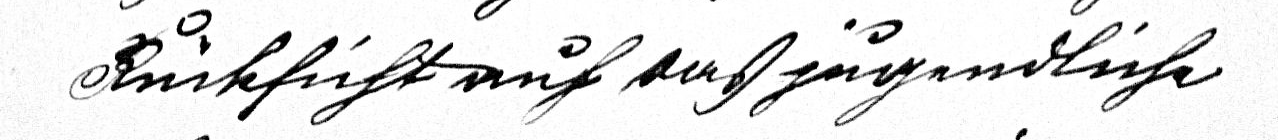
Rücksicht auf das jugendliche
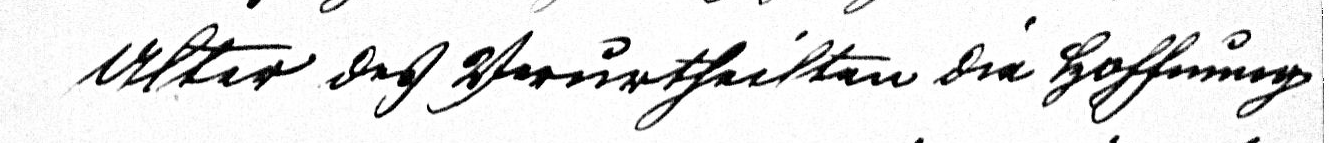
Alter des Verurtheilten die Hoffnung
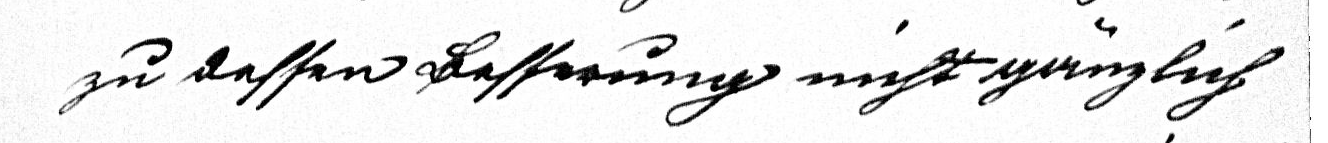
zu dessen Besserung nicht gänzlich
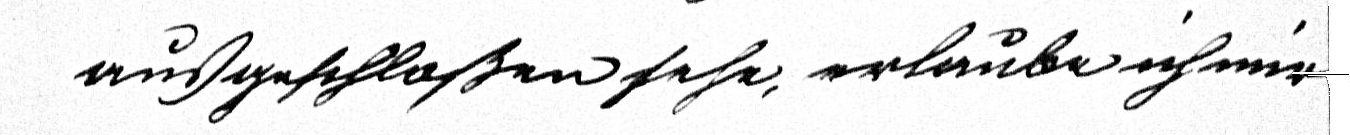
ausgeschloßen sehe, erlaube ich mir
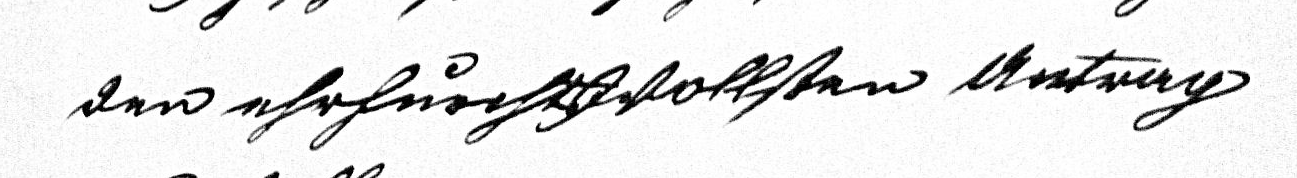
den ehrfurchtsvollsten Antrag
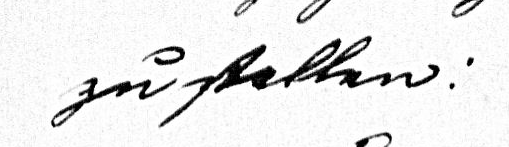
zu stellen:
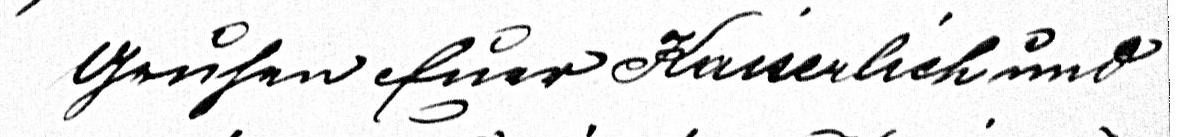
Grusen Euer Kaiserlich und
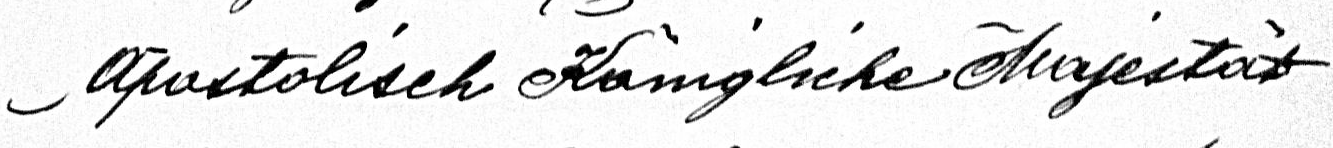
Apostolisch Königliche Majestät
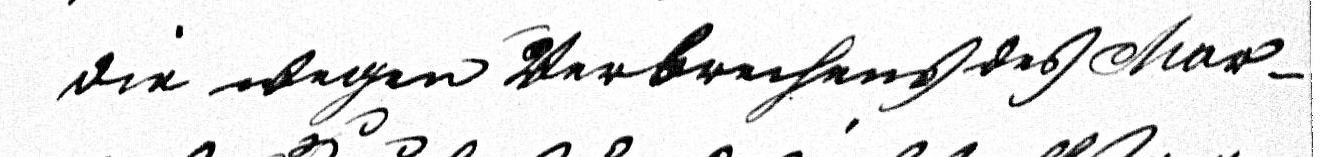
die wegen Verbrechens des Mor¬
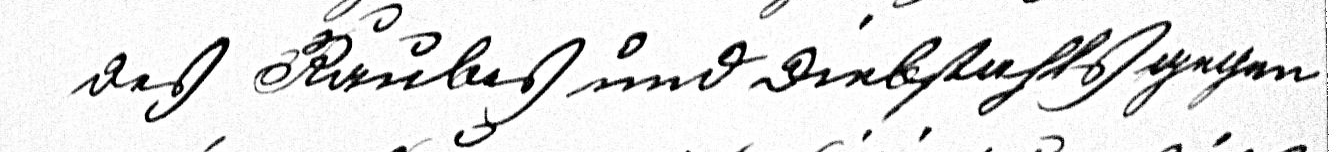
des Raubes und Diebstahls gegen
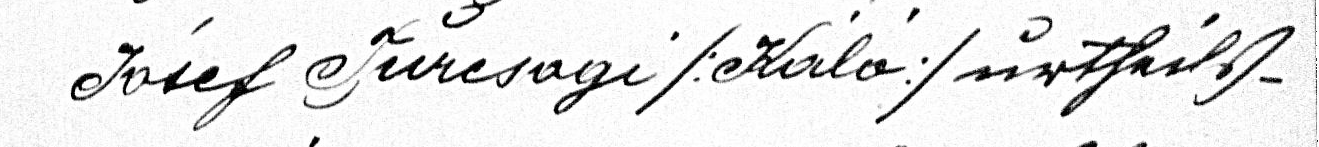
Jósef Turcsogi /: Káló:/ urtheils -
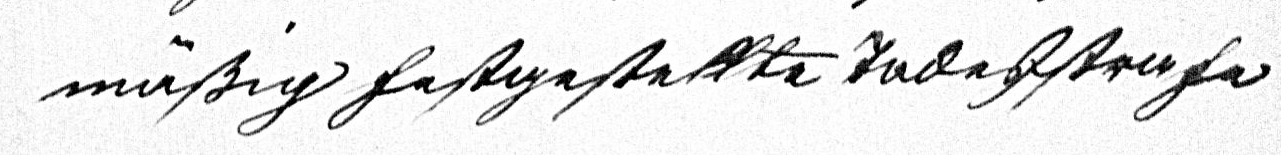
mäßig festgestellte Todesstrafe
